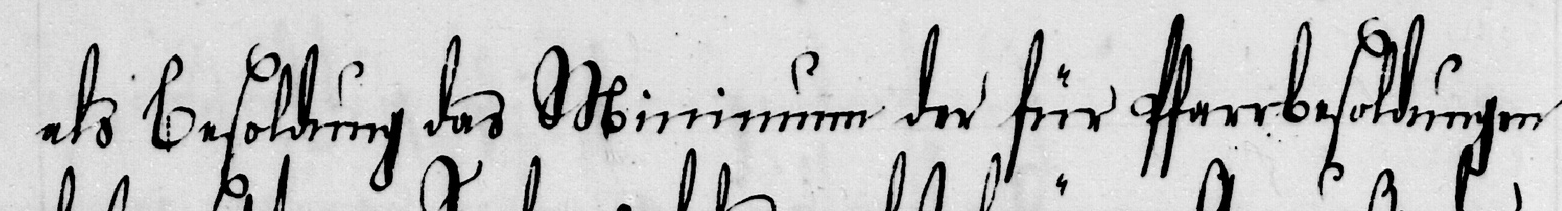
als Besoldung das Minimum der für Pfarrbesoldungen
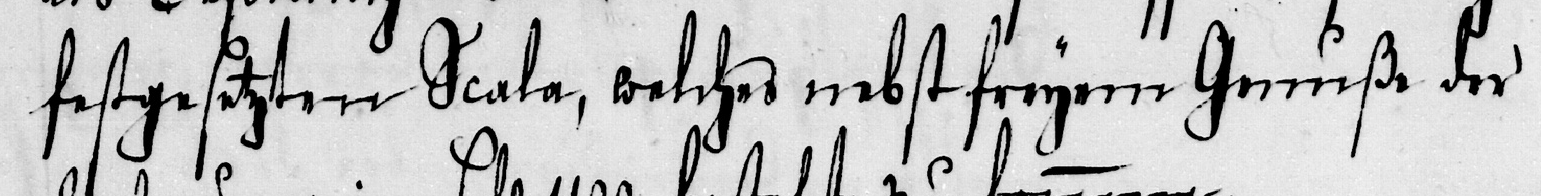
festgesetzten Scala, welches nebst freyem Genuße der
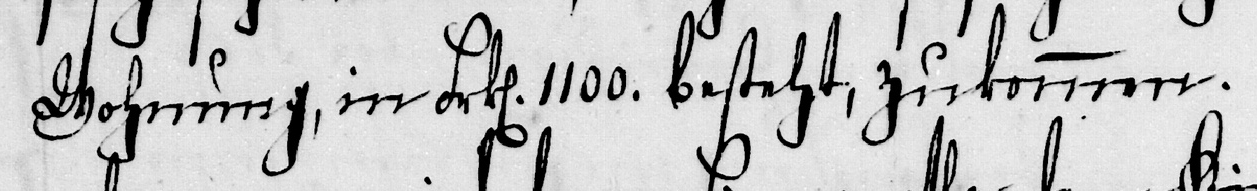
Wohnung, in Frk[en]. 1100. besteht, zukommen.
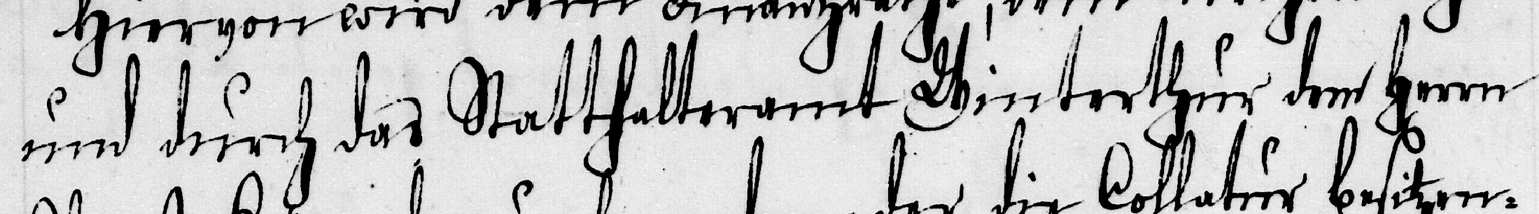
und durch das Statthalteramt Winterthur dem Herrn
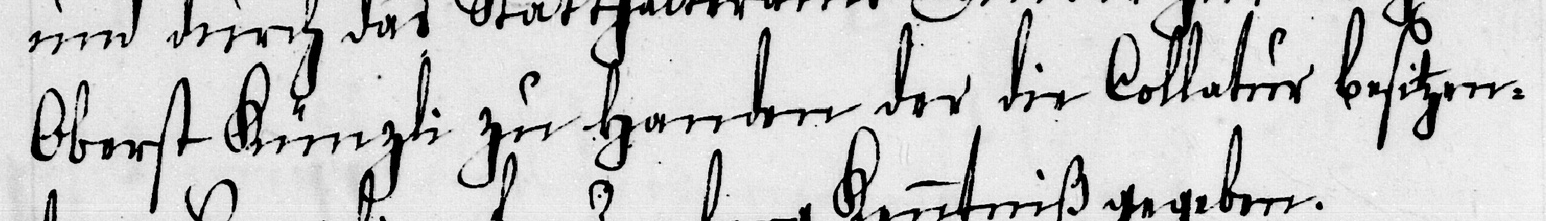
Oberst Künzli zu Handen der die Collatur besitzen¬
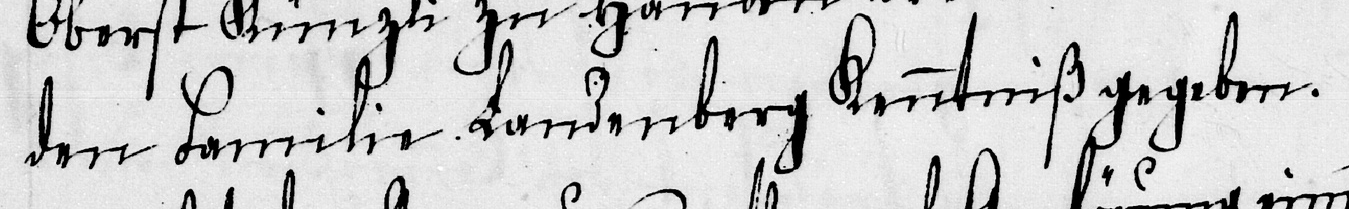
den Familie Landenberg Kenntniß gegeben.
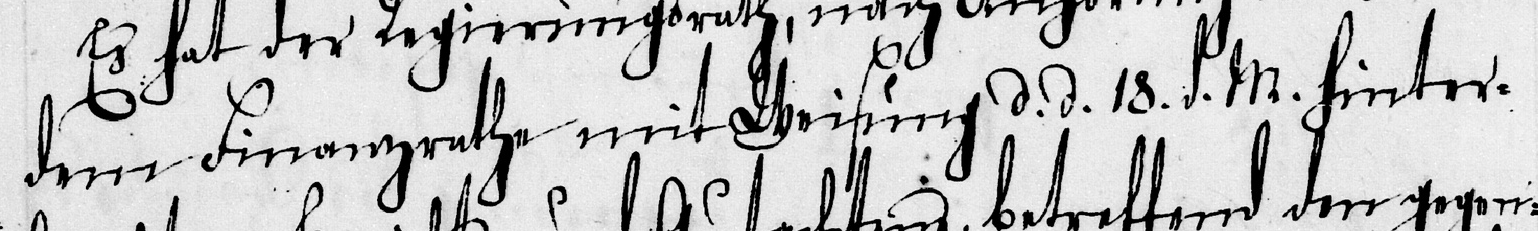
dem Finanzrathe mit Weisung d. d. 18. d. M. hinter¬
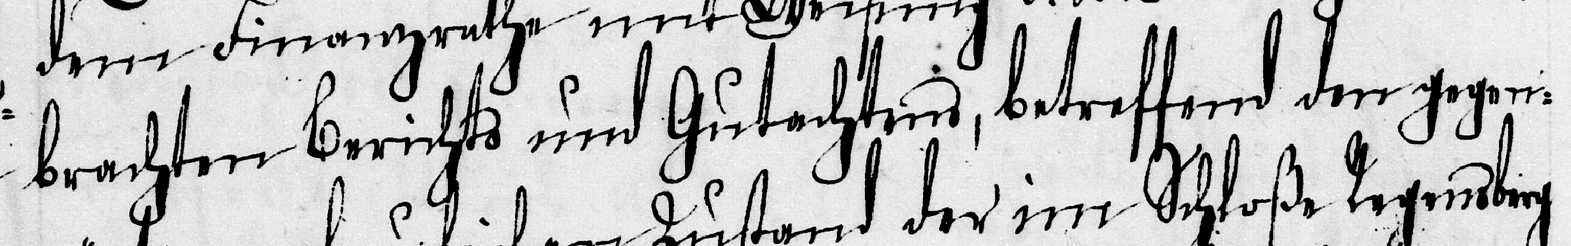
brachten Berichts und Gutachtens, betreffend den gegen¬
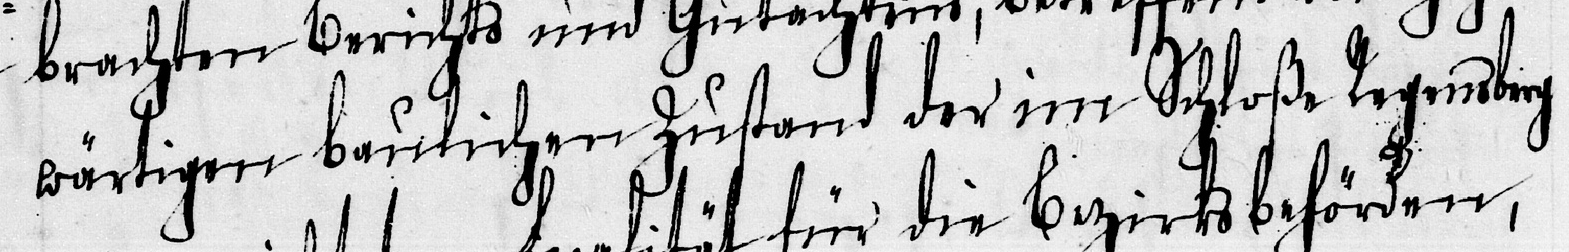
wärtigen baulichen Zustand der im Schloße Regensberg
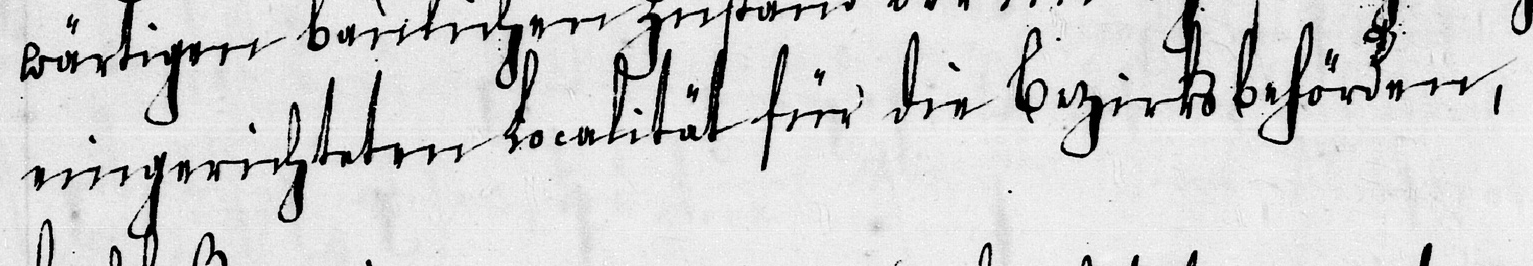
eingerichteten Localität für die Bezirksbehörden,
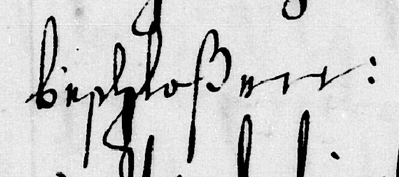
beschloßen:
